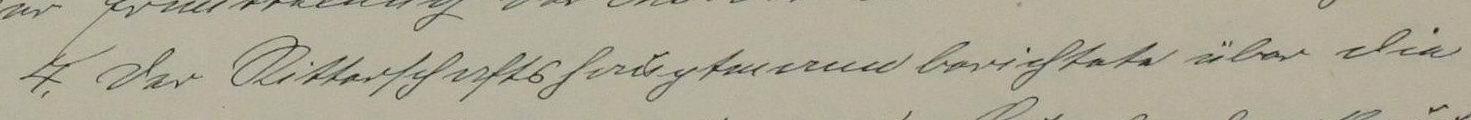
4. Der Ritterschaftshauptmann berichtete über die
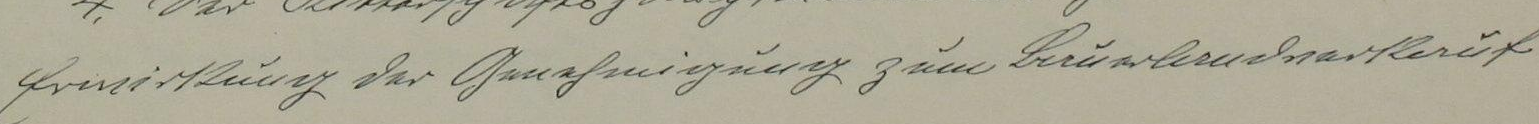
Erwirkung der Genehmigung zum Bauerlandverkauf
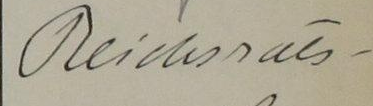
Reichsrats-
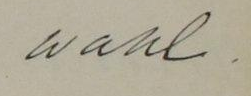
wahl
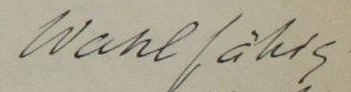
Wahlfähig-
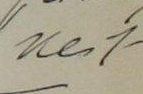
keit
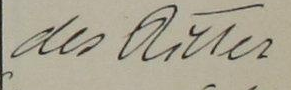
des Ritter
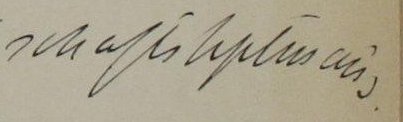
schaftshptmanns
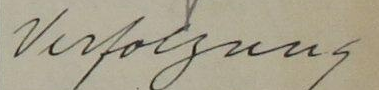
Verfolgung
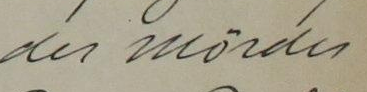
der Mörder
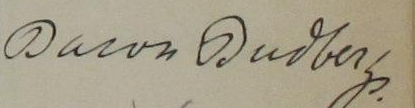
Baron Budbergs
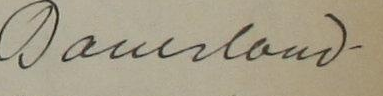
Bauerland-
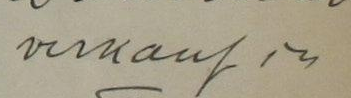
verkauf in
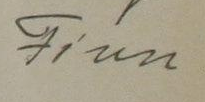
Finn
